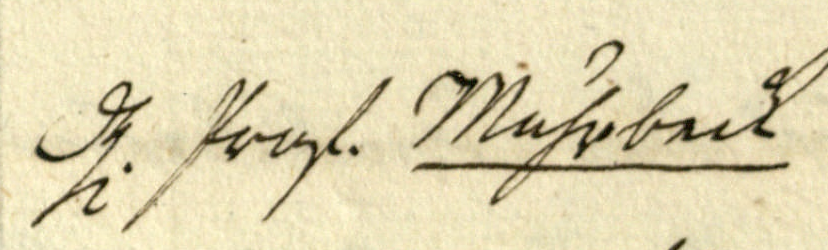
dh. Prof. Muhrbeck
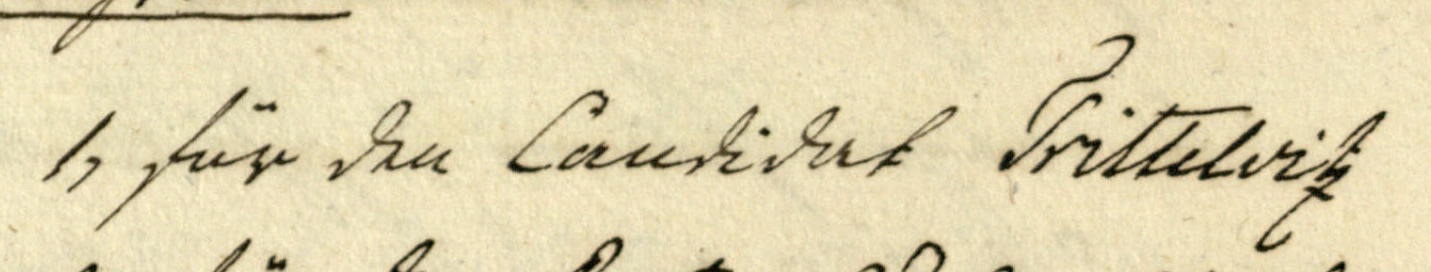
1, für den Candidat Trittelvitz
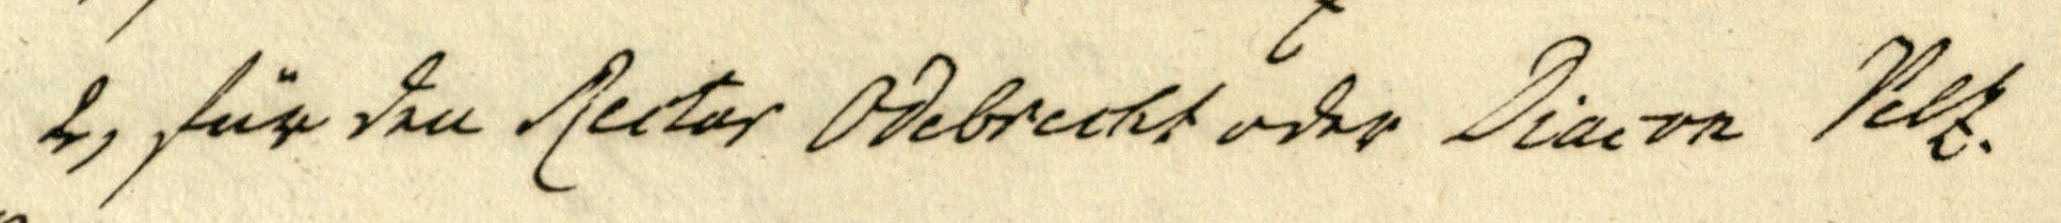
2, für den Rector Odebrecht oder Diacon Pelz.
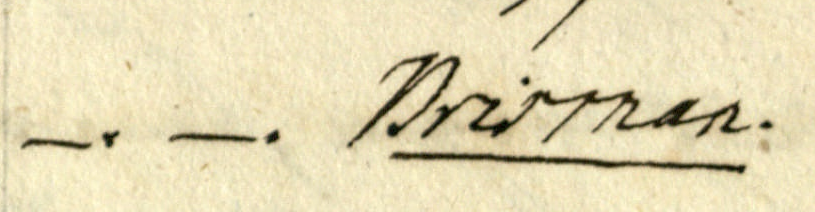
— " - "Brisman.
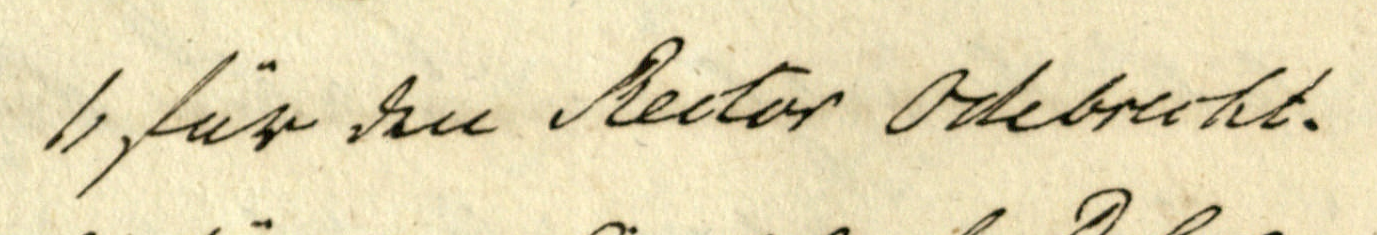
1, für den Rector Odebrecht.
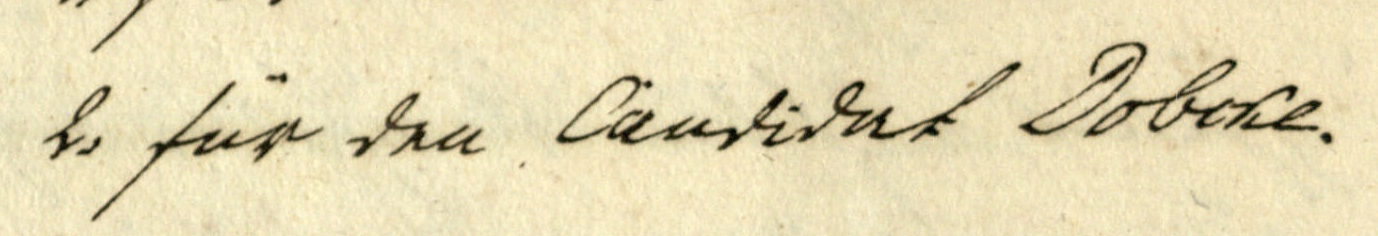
2. für den Candidat Dobcke.
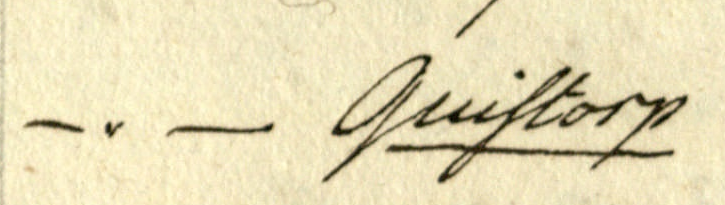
— "- Quistorp
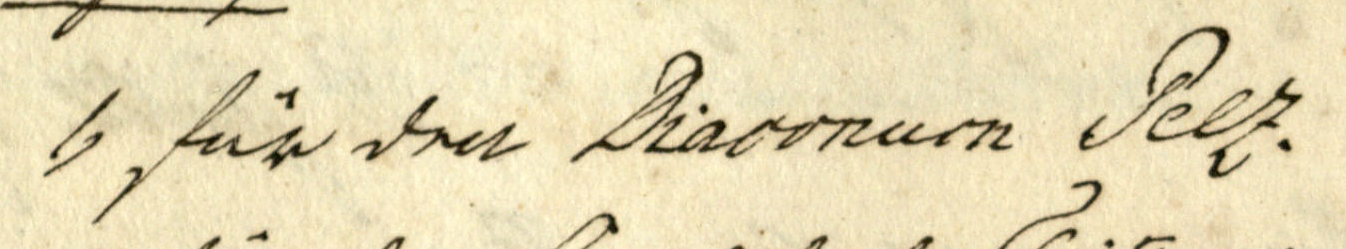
1. für den Diaconum Pelz.
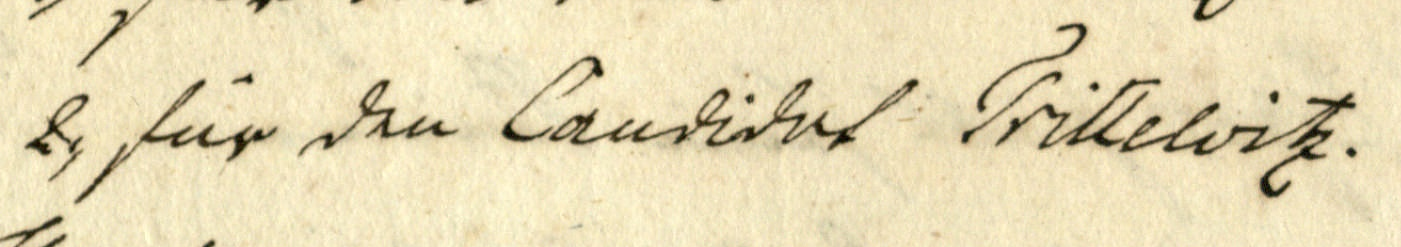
2, für den Candidat Trittelvitz.
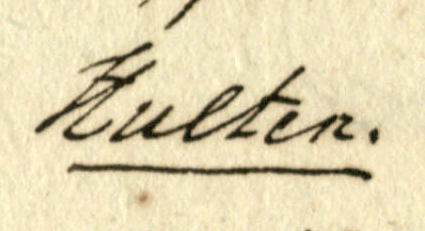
Hulten.
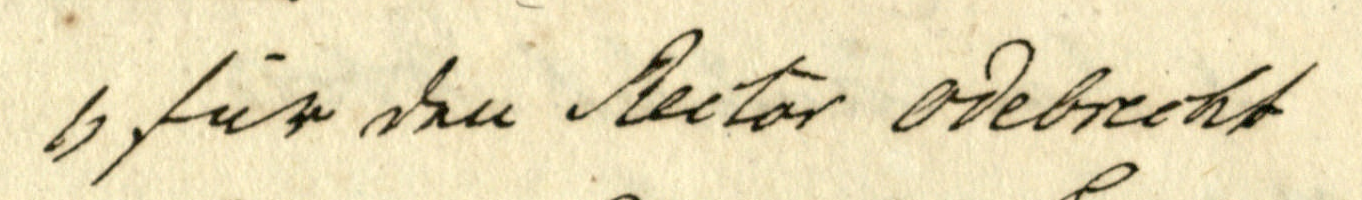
1, für den Rector Odebrecht
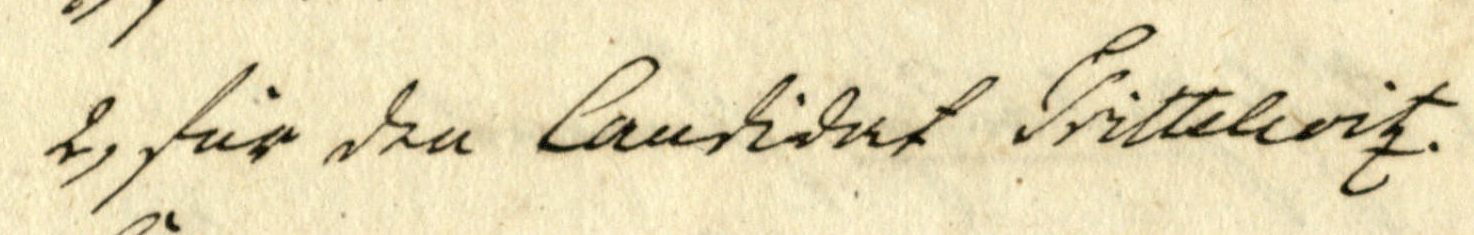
2, für den Candidat Trittelvitz.
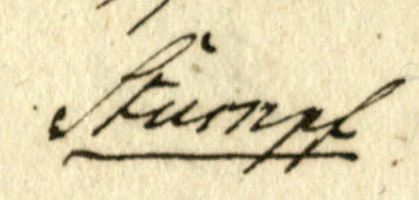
Stumpf.
